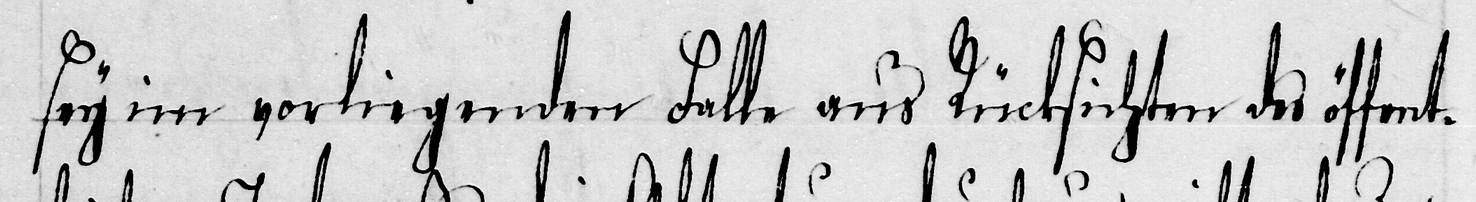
sey im vorliegenden Falle aus Rücksichten des öf¬
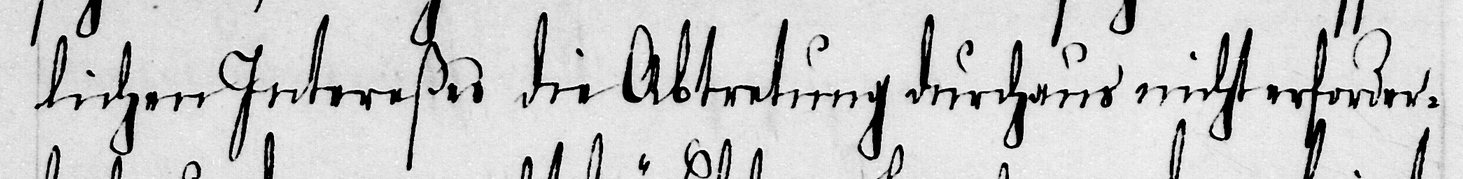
tlichen Intereßes die Abtretung durchaus nicht erforder¬
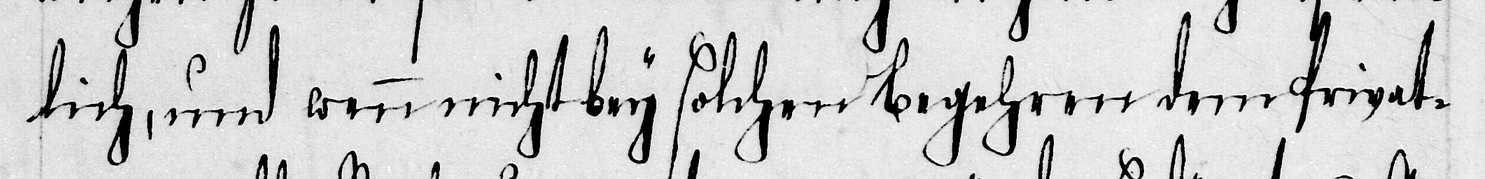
lich, und wenn nicht bey solchen Begehren dem Privat¬
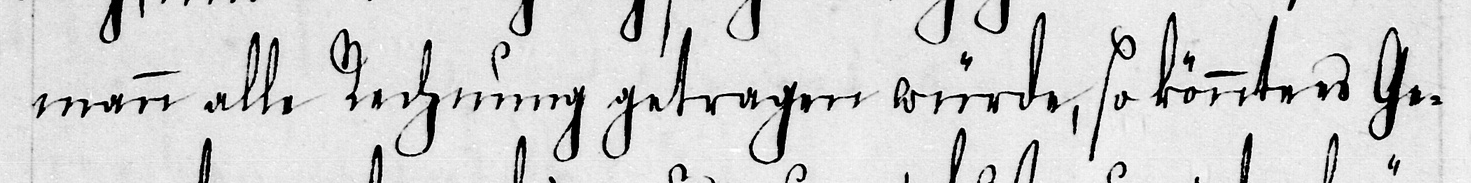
mann alle Rechnung getragen würde, so könnte es Ge¬
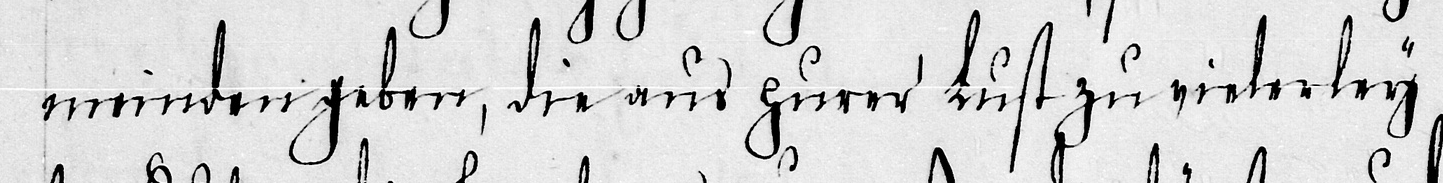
meinden geben, die aus purer Lust zu vielerley
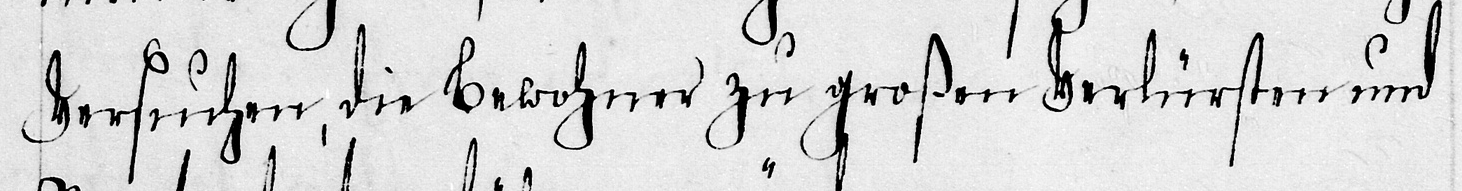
Versuchen, die Bewohner zu großen Verlürsten und
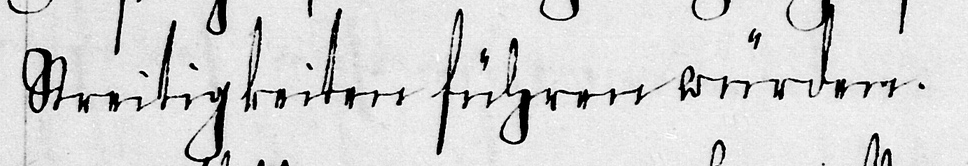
Streitigkeiten führen würden.
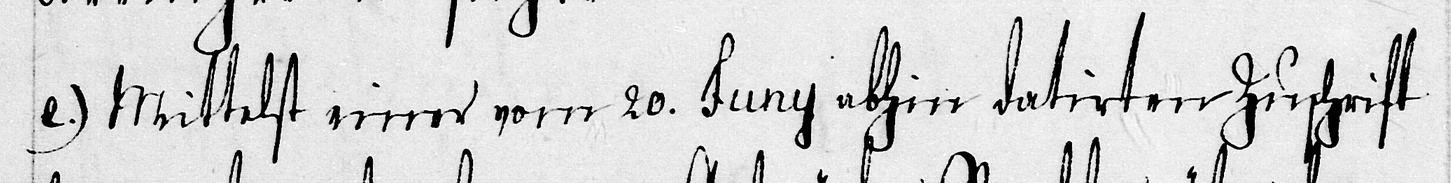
e.) Mittelst einer vom 20. Juny abhin datirten Zuschrift
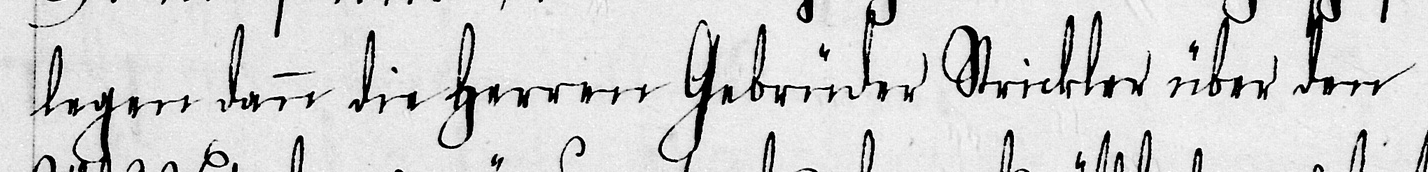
legen dann die Herren Gebrüder Strickler über den
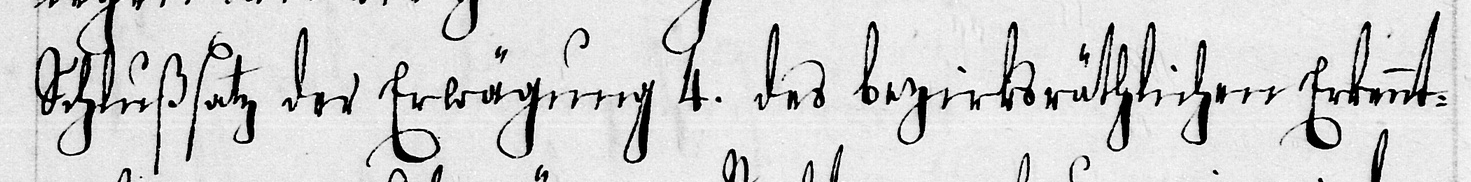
Schlußsatz der Erwägung 4. des bezirksräthlichen Erkenn¬
